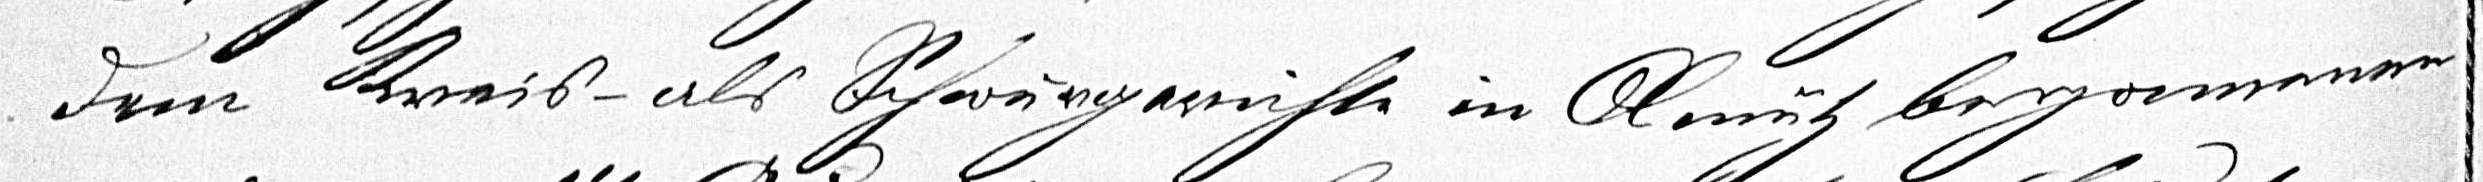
dem Kreis- als Schwurgerichte in Olmütz begonnenen
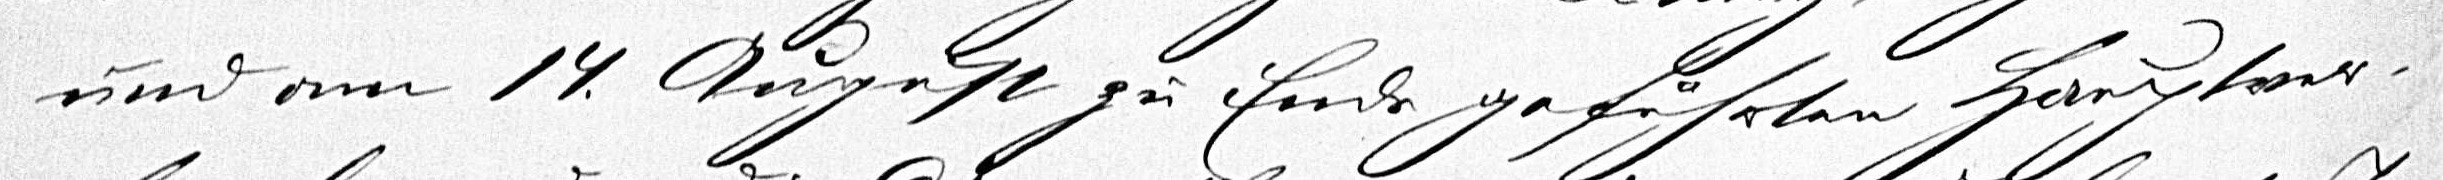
und am 14. August zu Ende geführten Hauptver¬
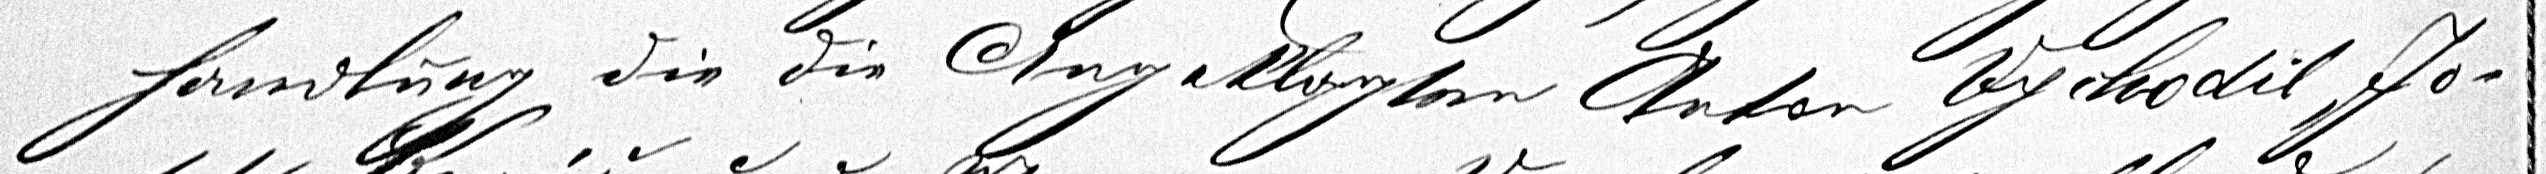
handlung die die Angeklagten Anton Vychodil, Jo¬
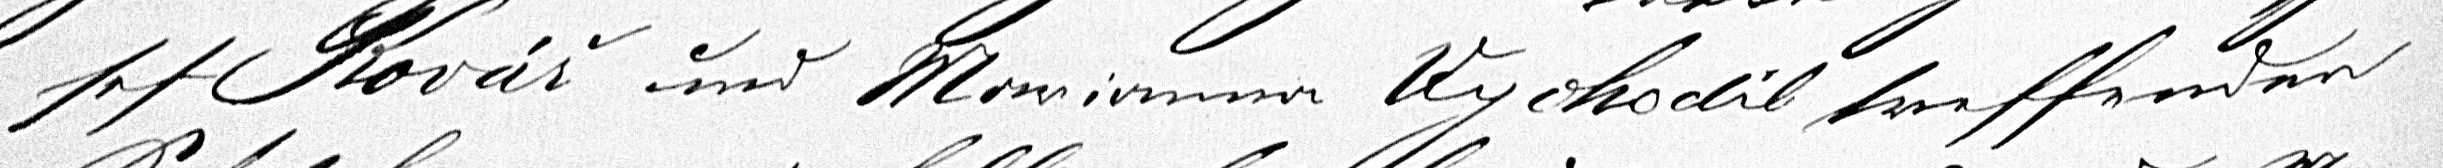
sef Kovár und Marianna Vychodil treffenden
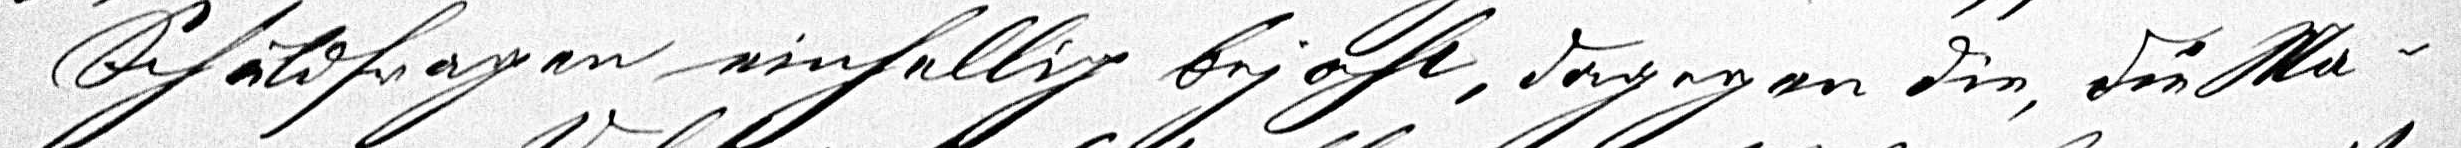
Schuldfragen einhellig bejaht, dagegen die, die Ma¬
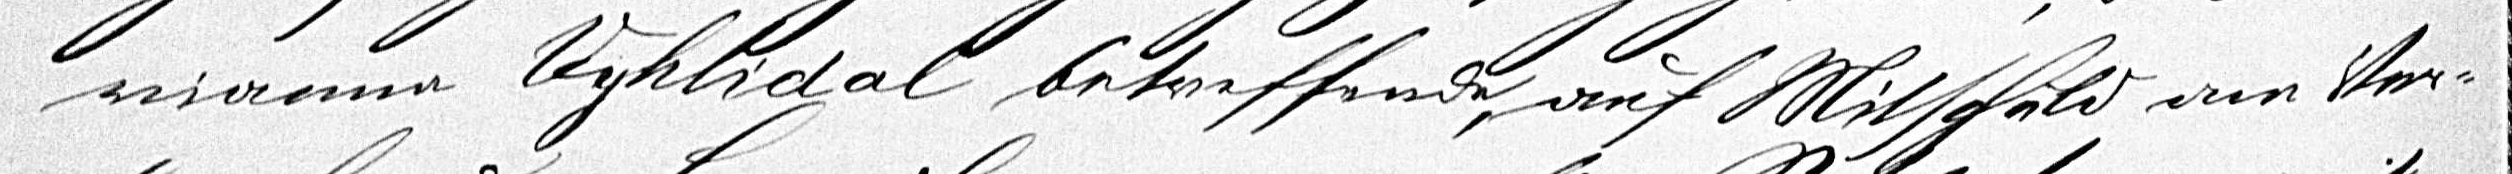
rianna Vyhlidal betreffende, auf Mitschuld am Ver¬
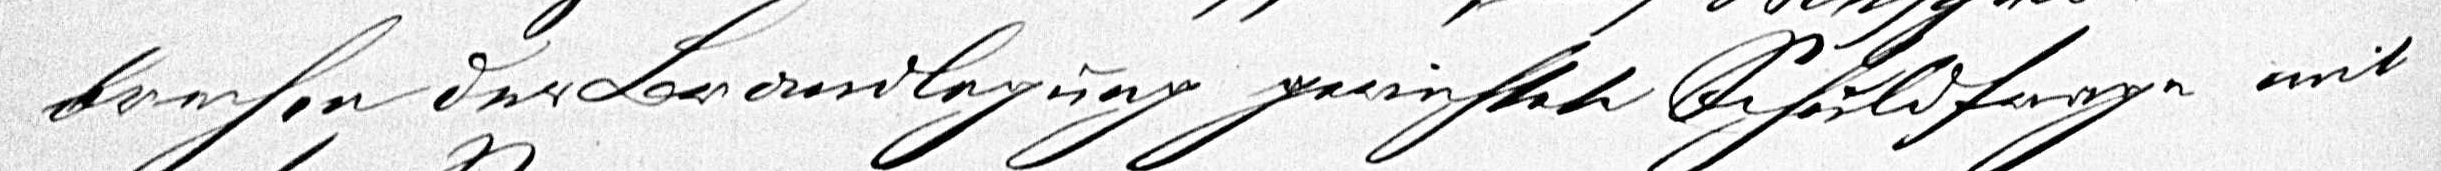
brechen der Brandlegung gerichtete Schuldfrage mit
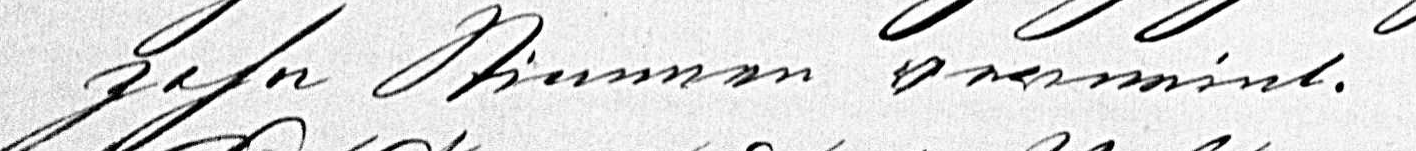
zehn Stimmen verneint.
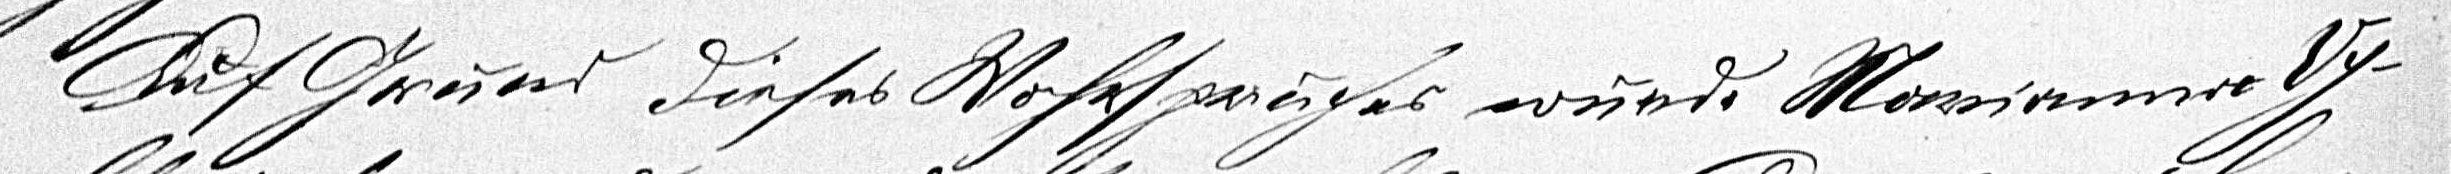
Auf Grund dieses Wahrspruches wurde Marianna Vy¬
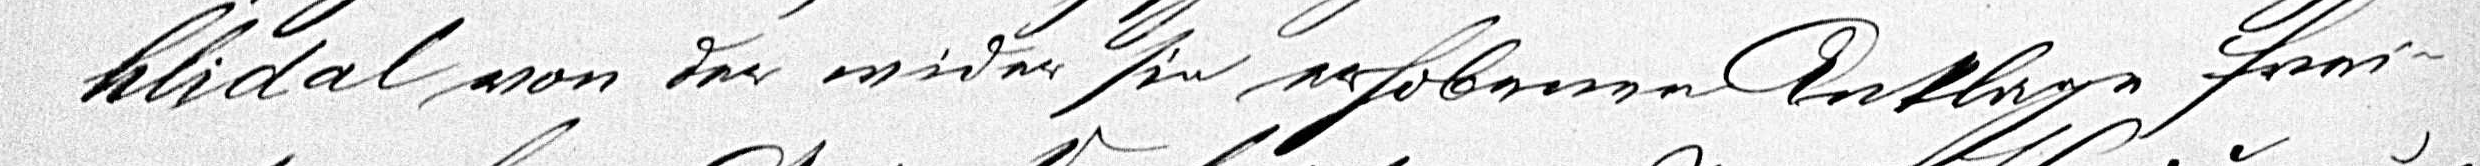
hlidal von der wider sie erhobenen Anklage Frei¬
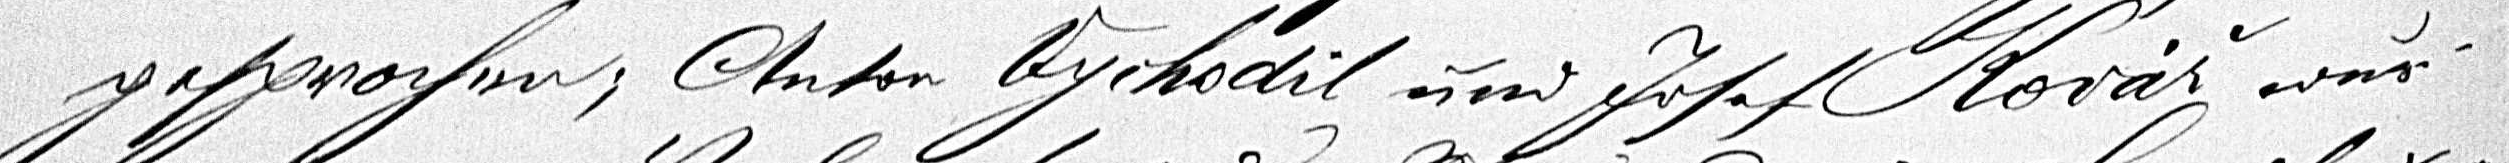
gesprochen; Anton Vychodil und Josef Kovár wur¬
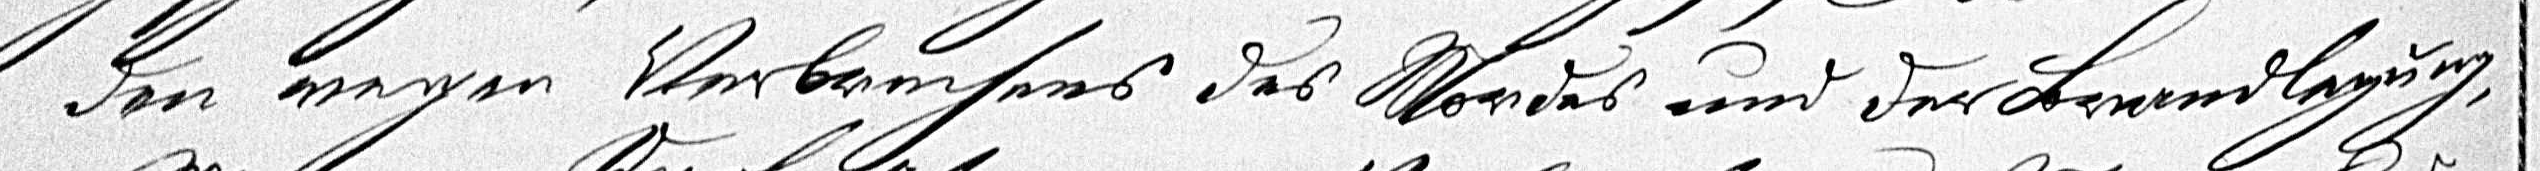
den wegen Verbrechens des Mordes und der Brandlegung,
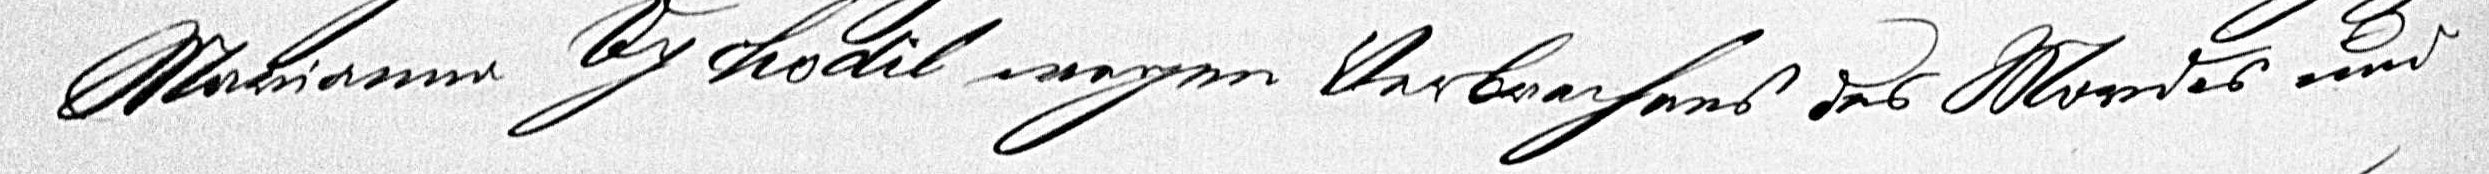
Marianna Vychodil wegen Verbrechens des Mordes und
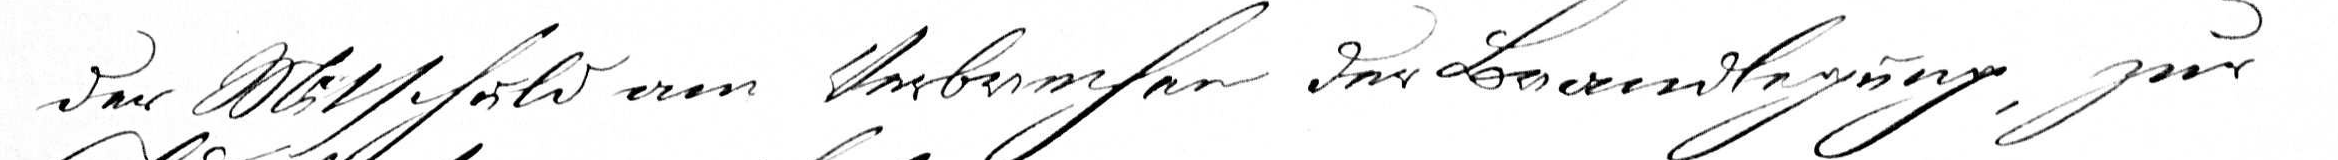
der Mitschuld am Verbrechen der Brandlegung, zur
